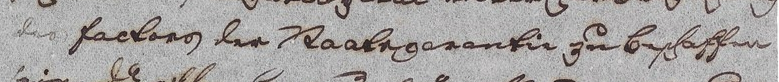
des Factors der Staatsgarantie zu beschaffen
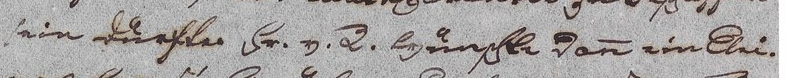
sein dürfte. Hr. v. R. wünschte dann ein klei-
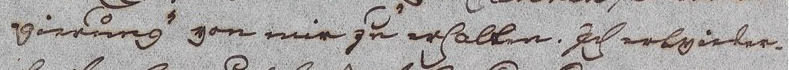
gierung» von mir zu erhalten. Ich erwieder-
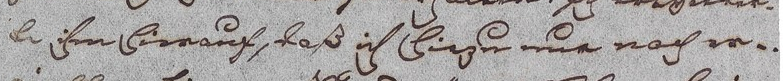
te ihm hierauf, daß ich hiezu nur nach er-
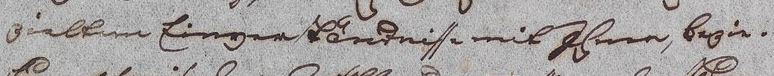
zieltem Einverständnisse mit Ihnen, bezie-
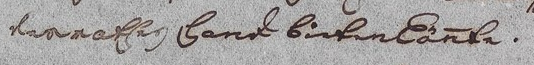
desrathes Hand bieten könnte.
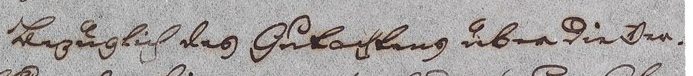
Bezüglich des Gutachtens über die Ver-
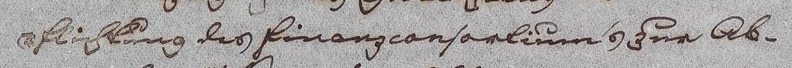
pflichtung des Finanzconsortium's zur Ab-
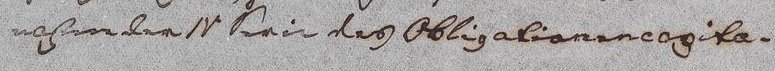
nahme der IV Serie des Obligationencapita-
